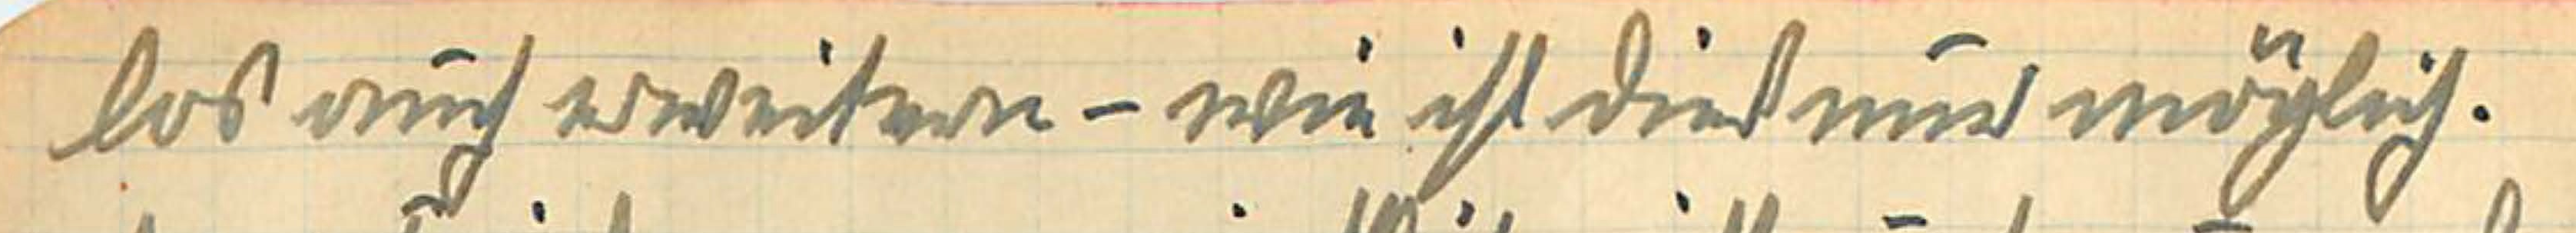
los auch erweitern – wie ist dies nur möglich.
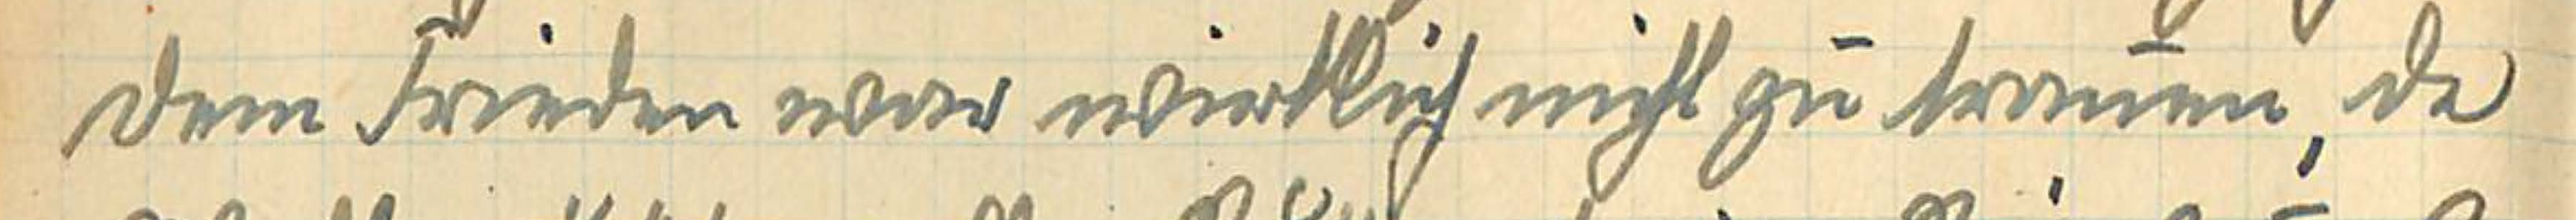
Dem Frieden war wirklich nicht zu trauen, der
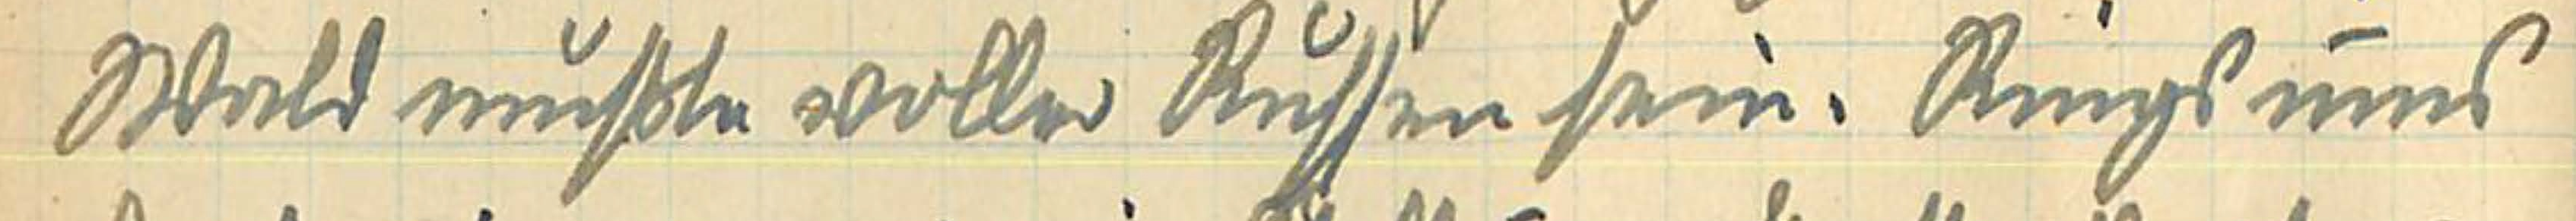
Wald mußte voller Russen sein. Rings ums
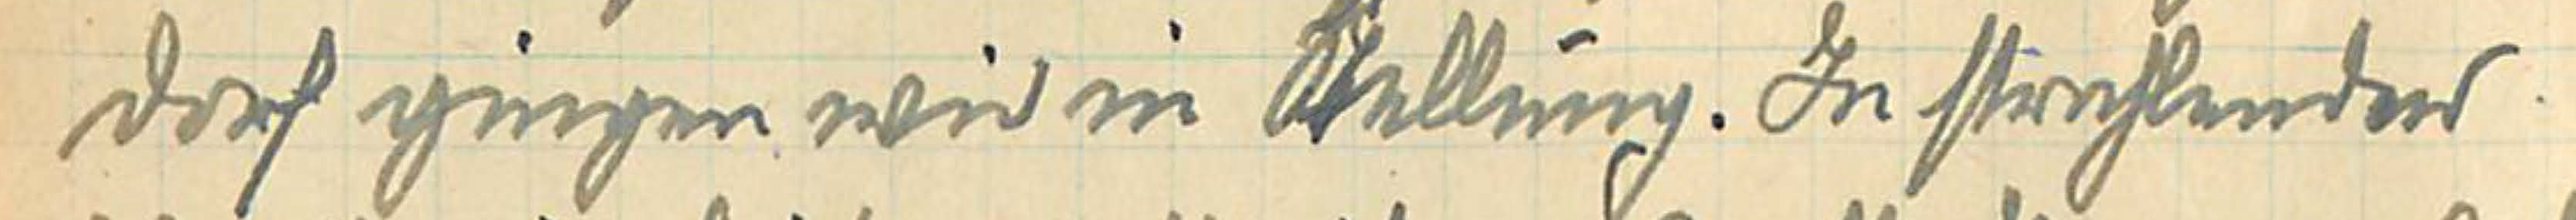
Dorf gingen wir in Stellung. In strahlender
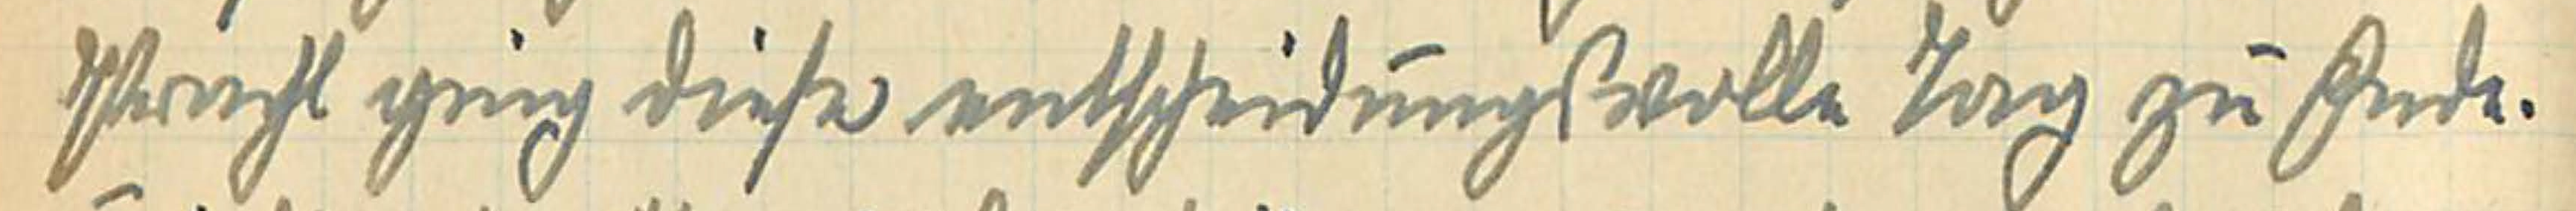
Pracht ging dieser entscheidungsvolle Tag zu Ende.
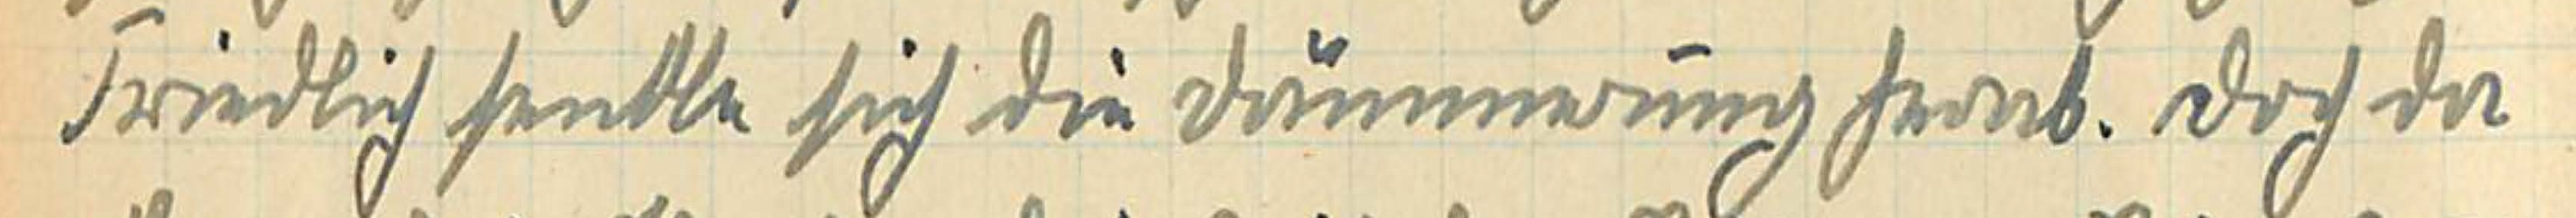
Friedlich senkte sich die Dämmerung herab. Doch da
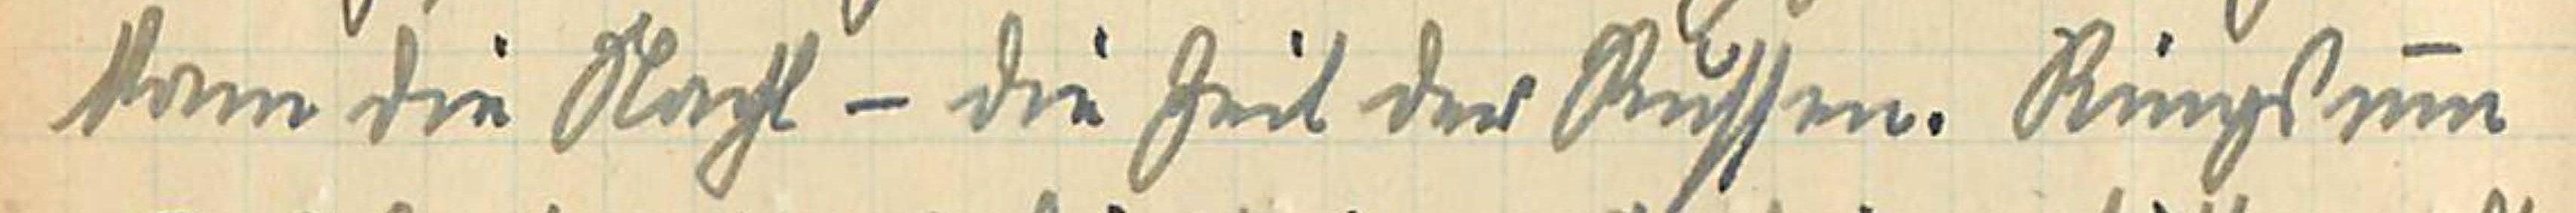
kam die Nacht – die Zeit der Russen. Rings um
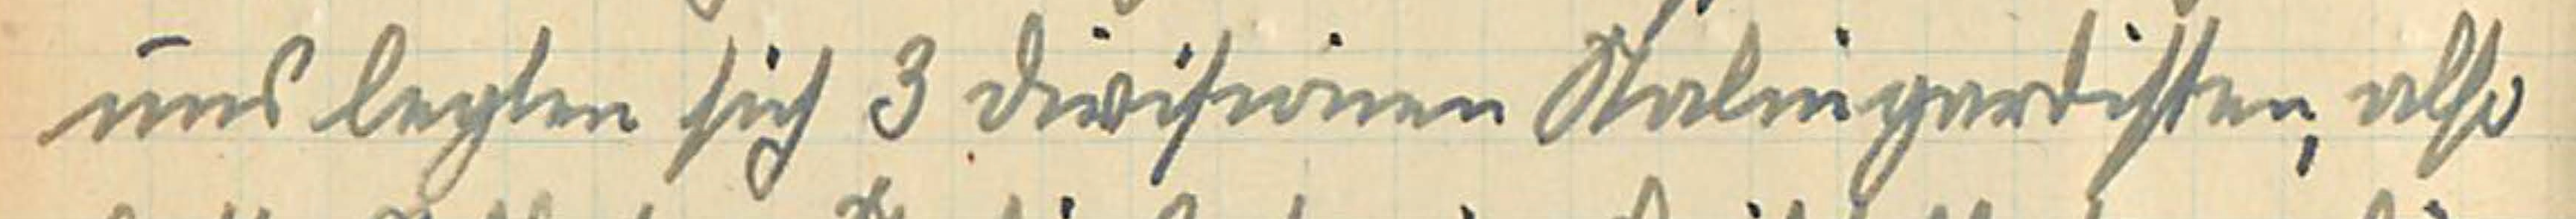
uns legten sich 3 Divisionen Stalingardisten, also
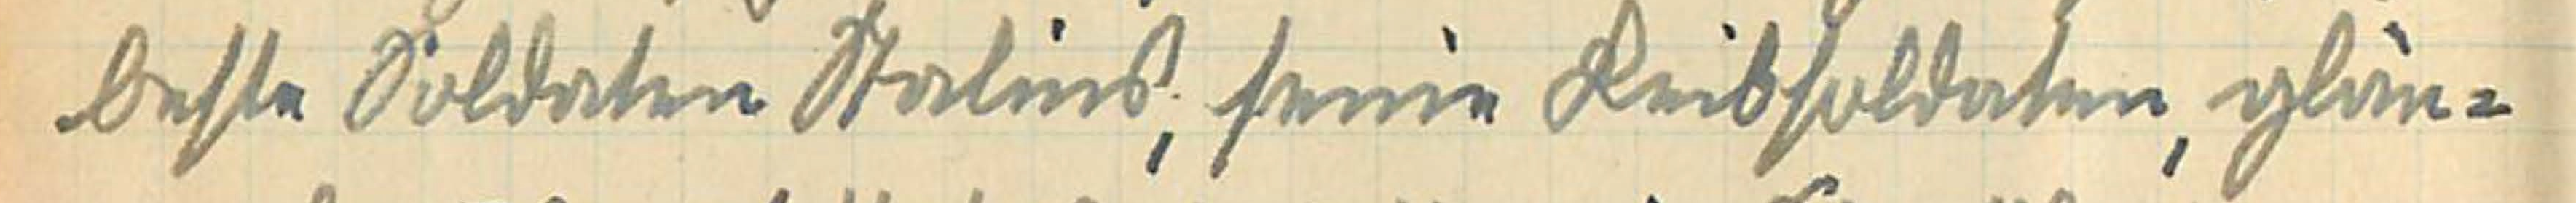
beste Soldaten Stalins, seine Leibsoldaten, glän-
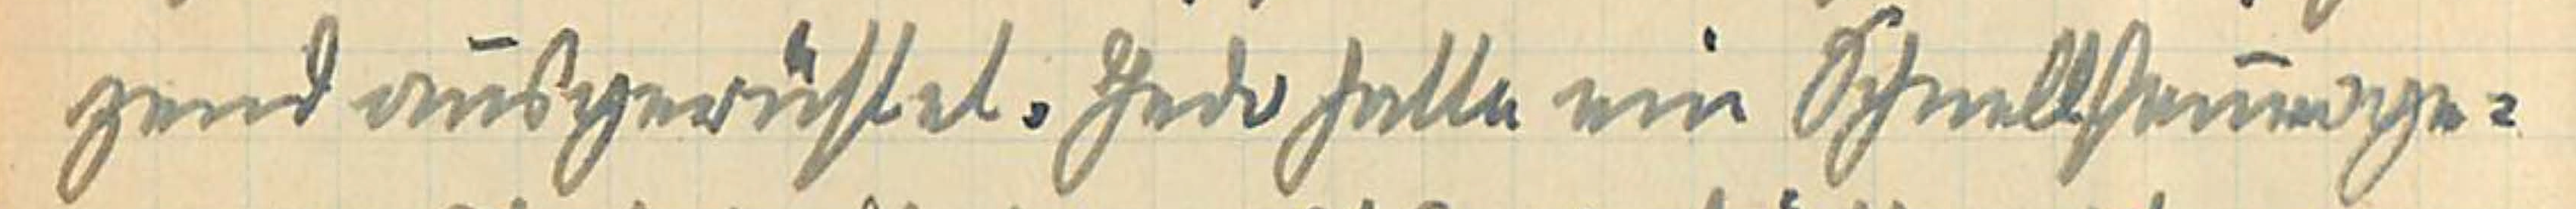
zend ausgerüstet. Jeder hatte ein Schnellfeuerge-
